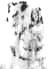閟（閉）
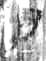夕
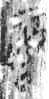啟
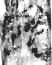朝
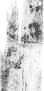○（得）
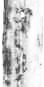晝
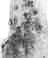不
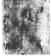○（得）
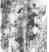不
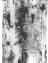○（得）
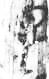見
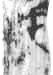疾
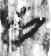㠯（以）
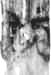疾
